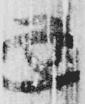正（征）
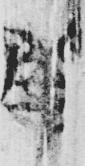○（關）
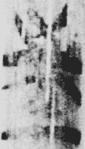市
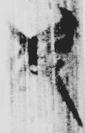民
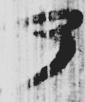乃
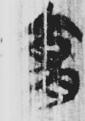宜
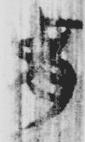夗（怨）
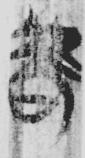唬（虐）
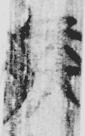疾
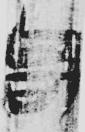○（始）
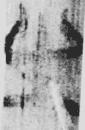生
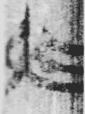於
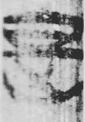是
